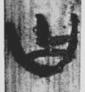曰
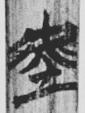○（吾）
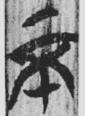不
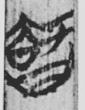智（智→知）
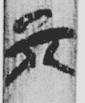亓
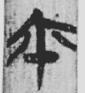尔
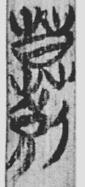○（墓）
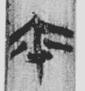尔
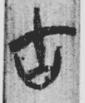古（姑）
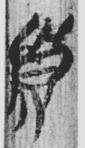須
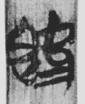既
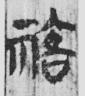○（落）
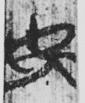○（焉）
